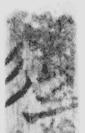{辶侃}
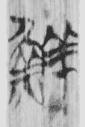鮮
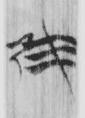隹
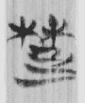楚
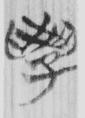學
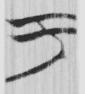于
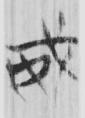威
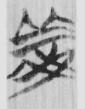義
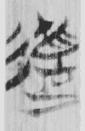{辶惪}
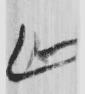亡
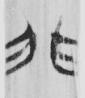非
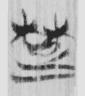楚
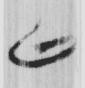㠯（以）
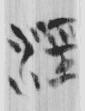涇
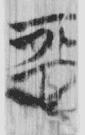{二外心}
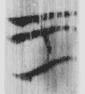王
